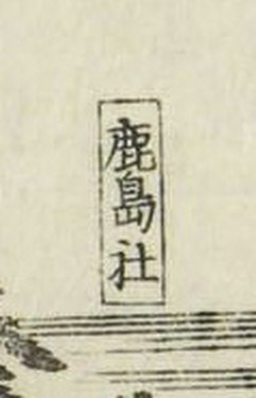鹿島社

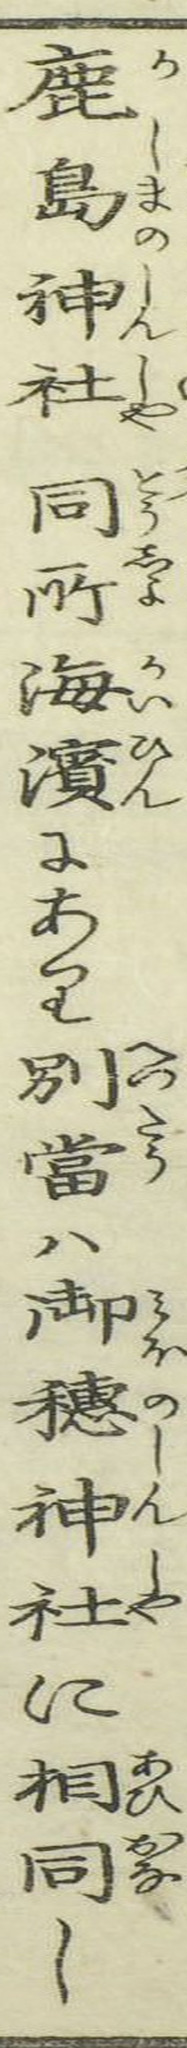鹿島神社同所海濱にあり別當は御穂神社に相同し
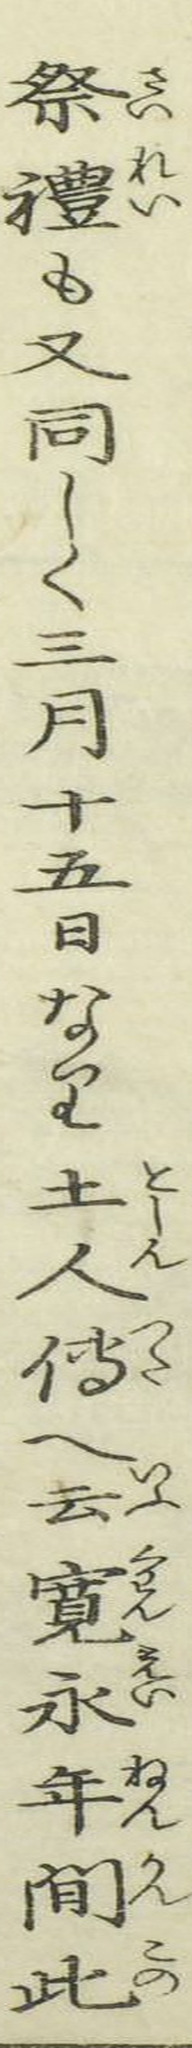祭禮も又同しく三月十五日なり土人傳へ云寛永年間此
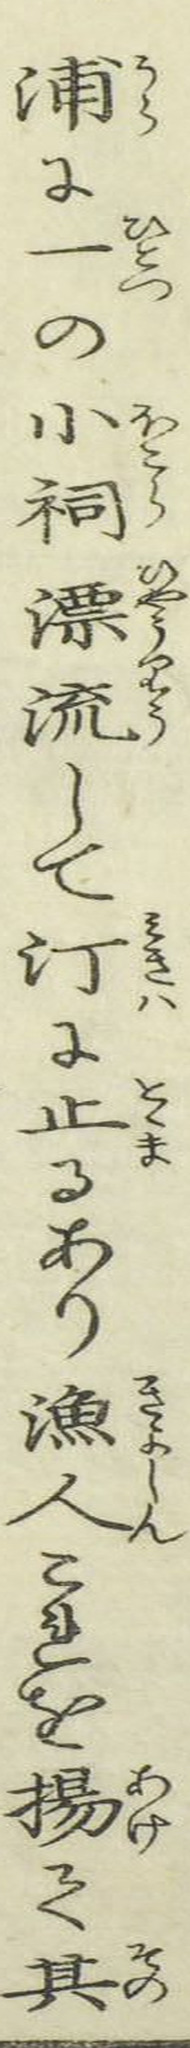浦に一の小祠漂流して汀に止るあり漁人これを揚て其
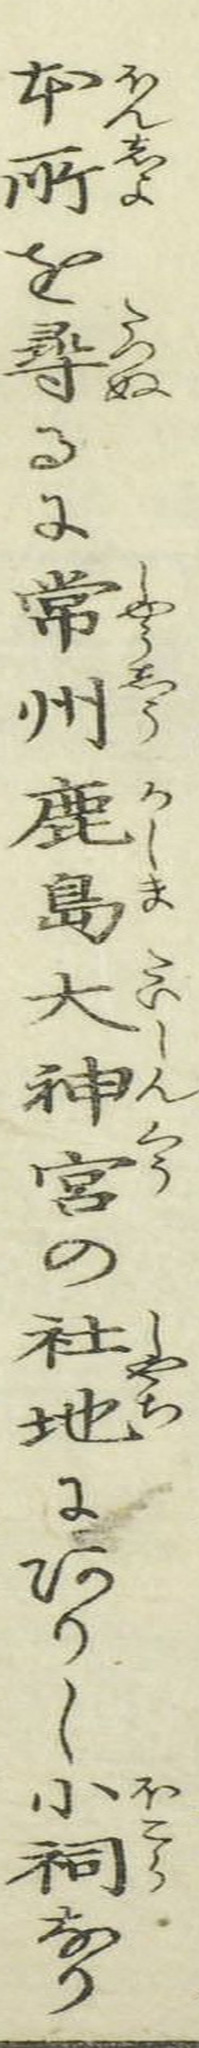本所を尋るに常州鹿島大神宮の社地にありし小祠なり
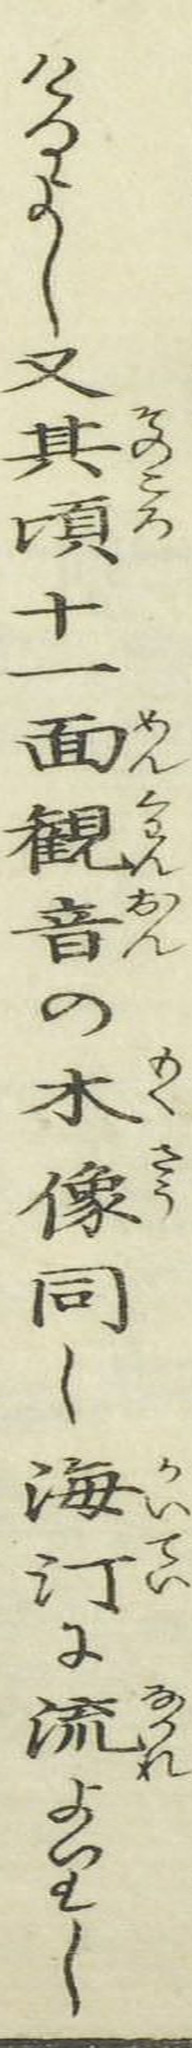けるよし又其頃十一面観音の木像同し海汀に流よりし
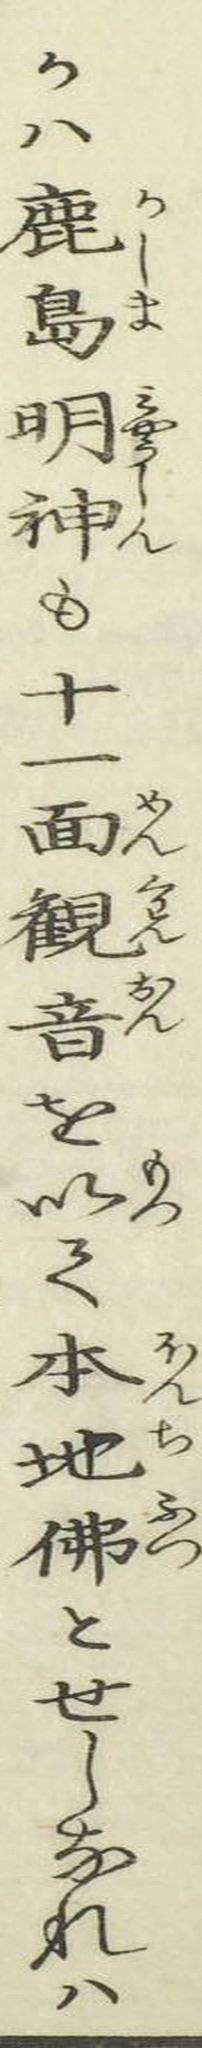かは鹿島明神も十一面観音を以て本地佛とせしなれは
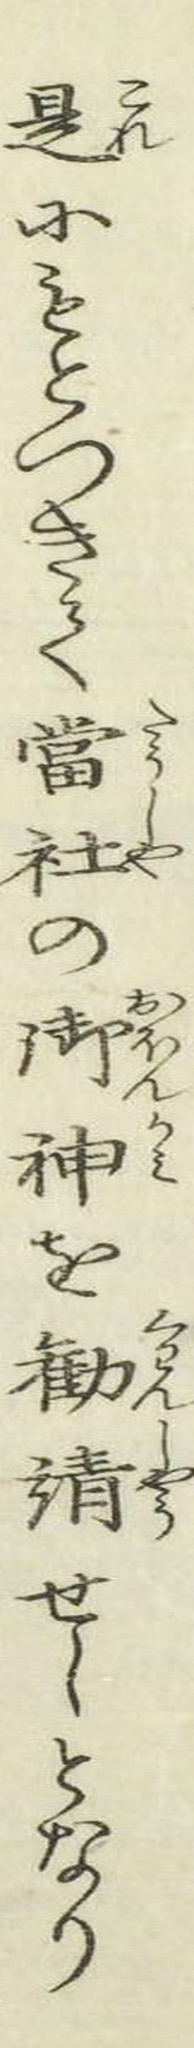是にもとつきて當社の御神を勧請せしとなり
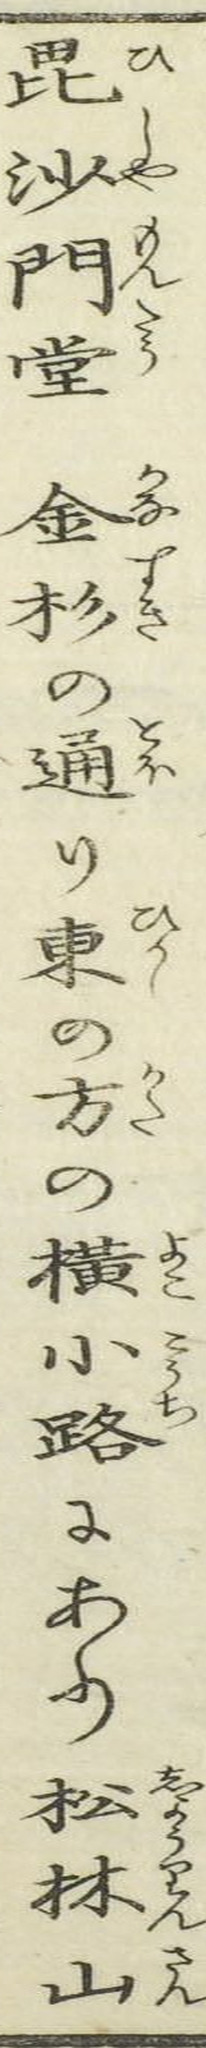毘沙門堂金杉の通り東の方の横小路にあり松林山
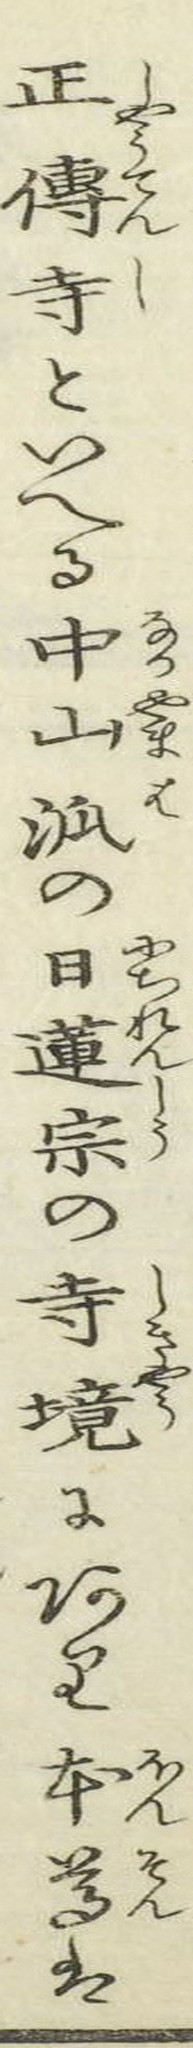正傳寺といへる中山派の日蓮宗の寺境にあり本尊は
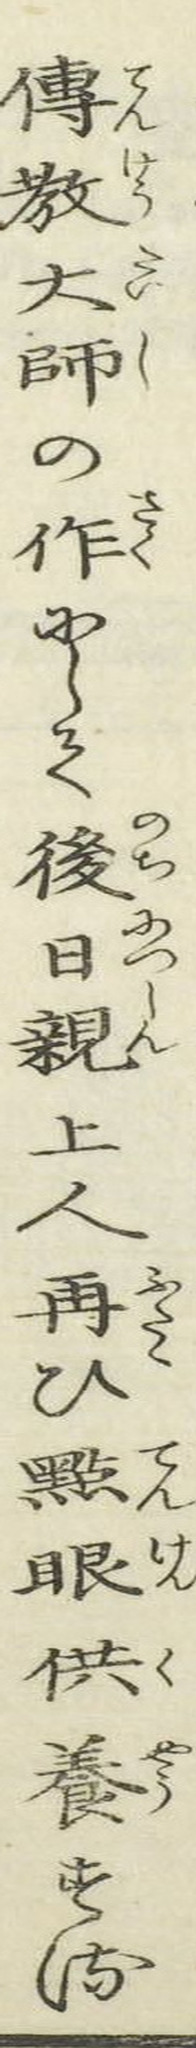傳教大師の作にして後日親上人再ひ點眼供養する
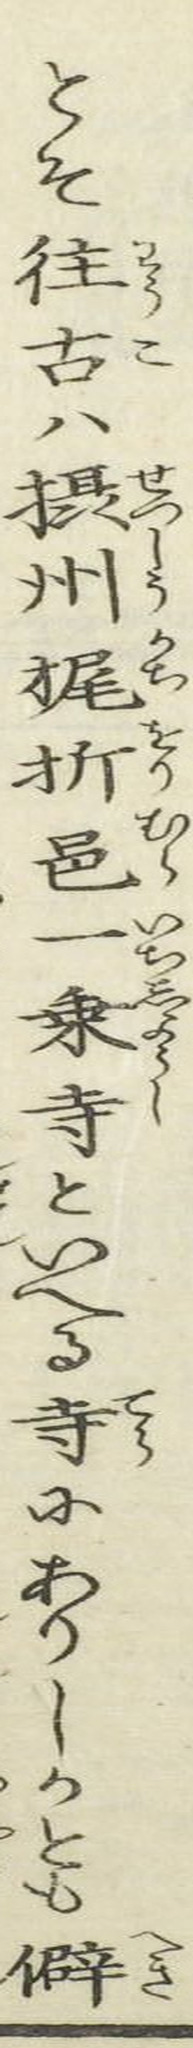とそ往古は摂州梶折邑一乗寺といへる寺にありしかとも僻
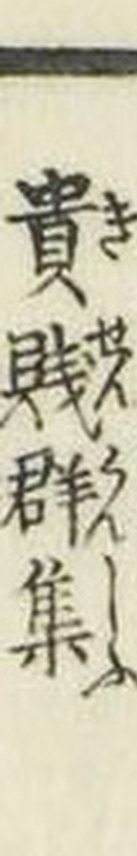貴賤群集
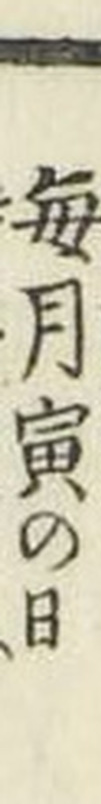毎月寅の日
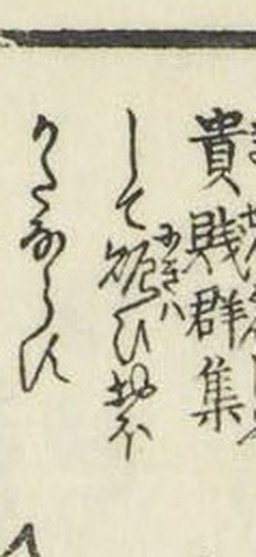して賑ひおほ
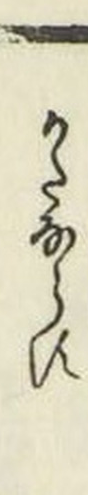かたならす
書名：江戸名所図会 20巻 巻之3
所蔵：東京学芸大学教育コンテンツアーカイブ
